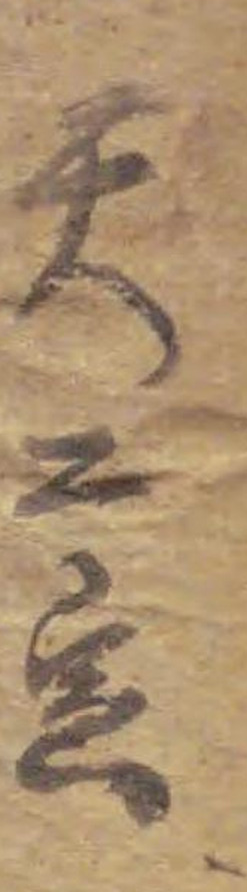天二寅
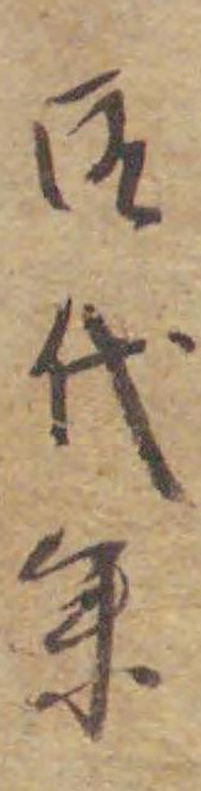御代参

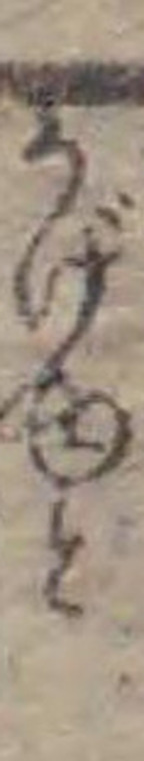かげゆと
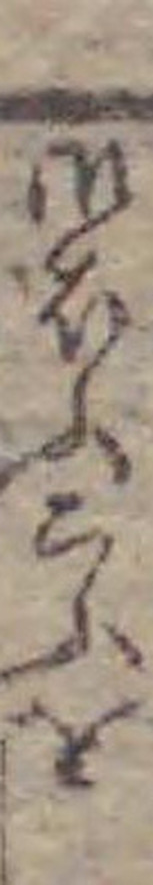御ほふこふを
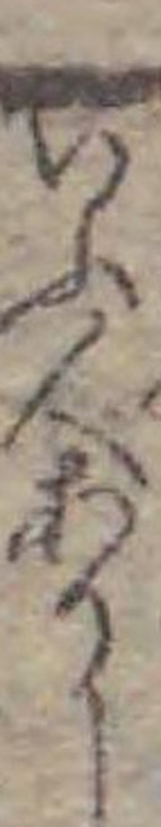いふ人あり
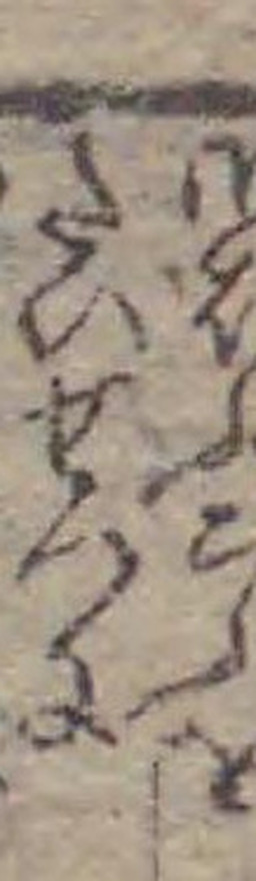たいせつに
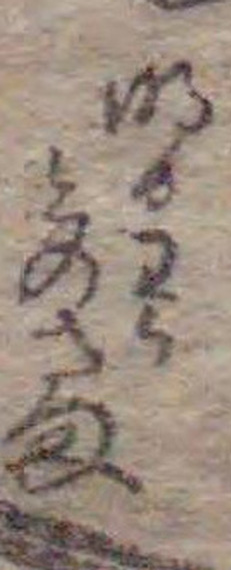とのさま
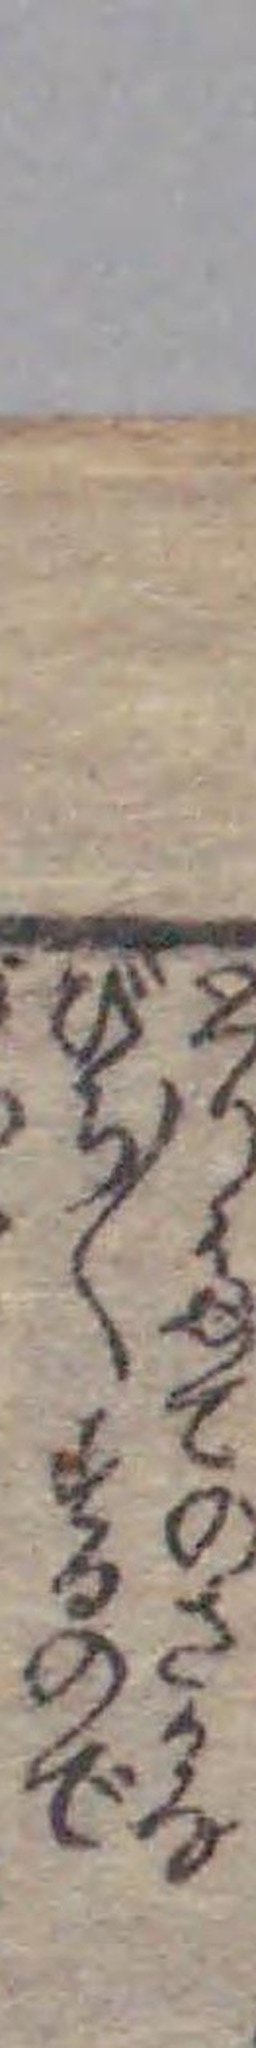びち〳〵するので
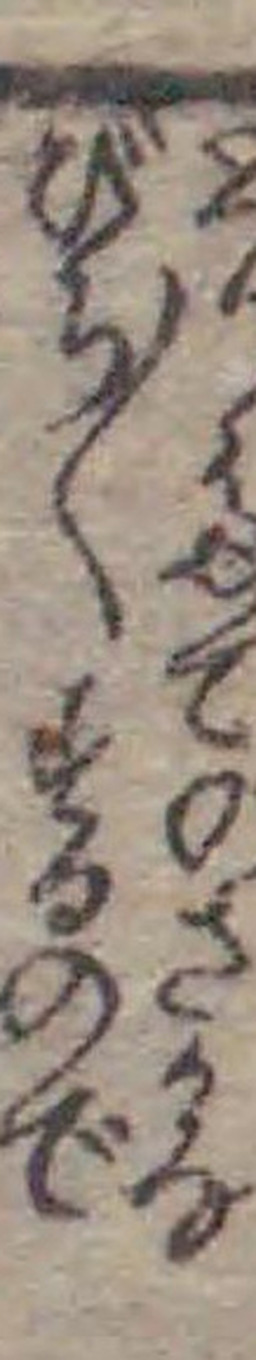びち〳〵するので
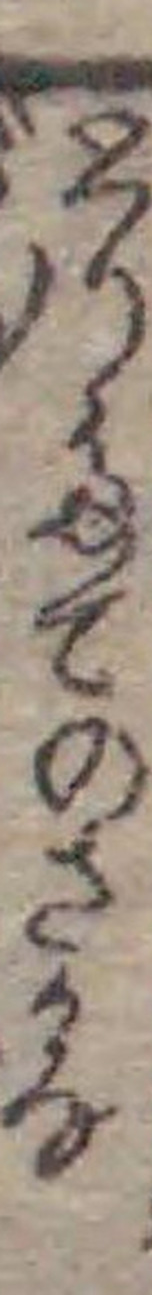とりたてのさかな
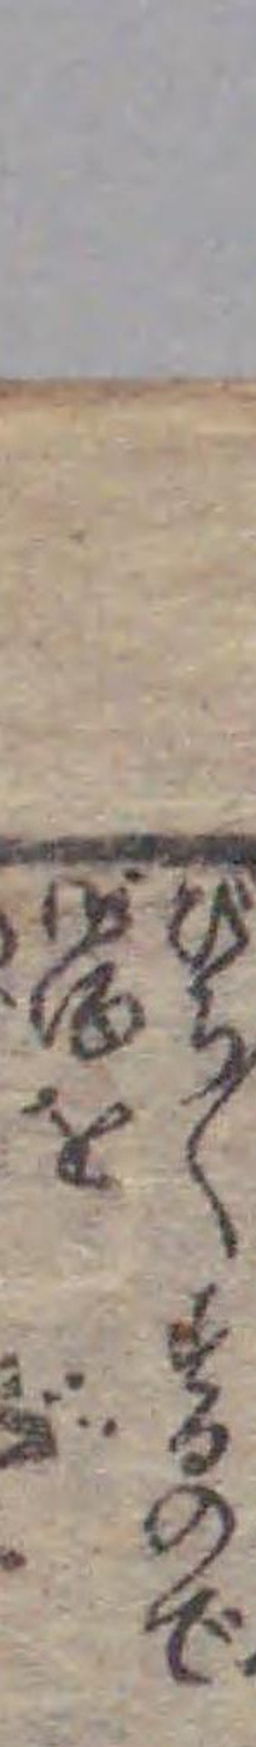御酒を
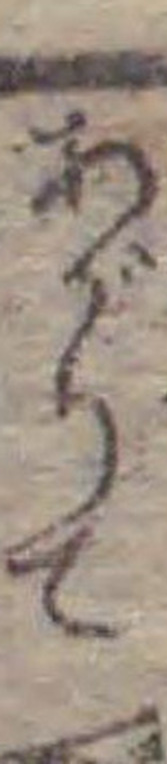あがりて
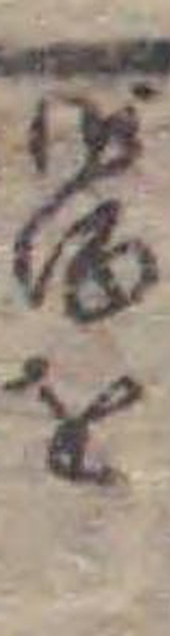御酒を
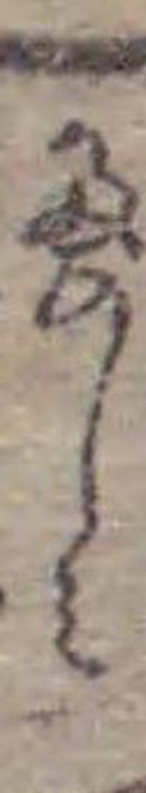たのしみ
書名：御代参丑時詣 : 3巻
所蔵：国立国会図書館 National Diet Library, JAPAN
